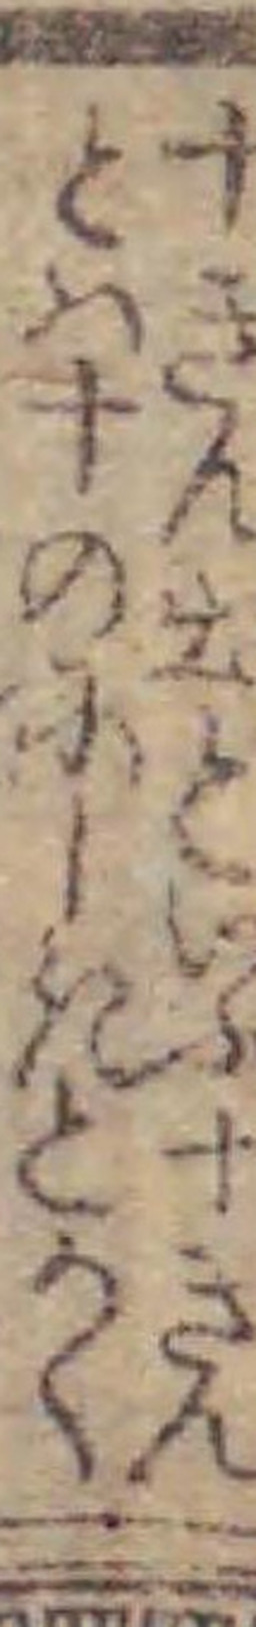とは十のにしきとかく
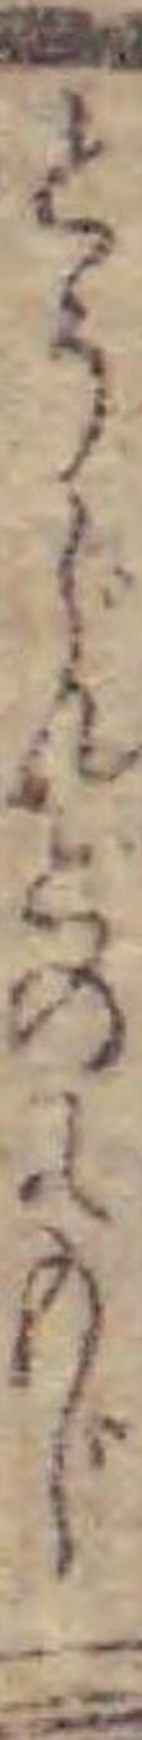とうじんどのにもじ
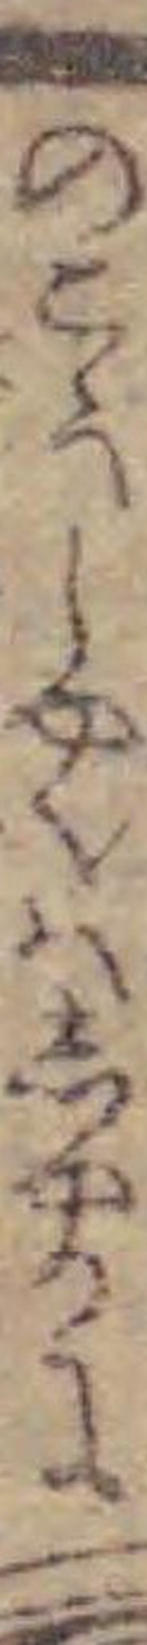のこうしやくはしやかに
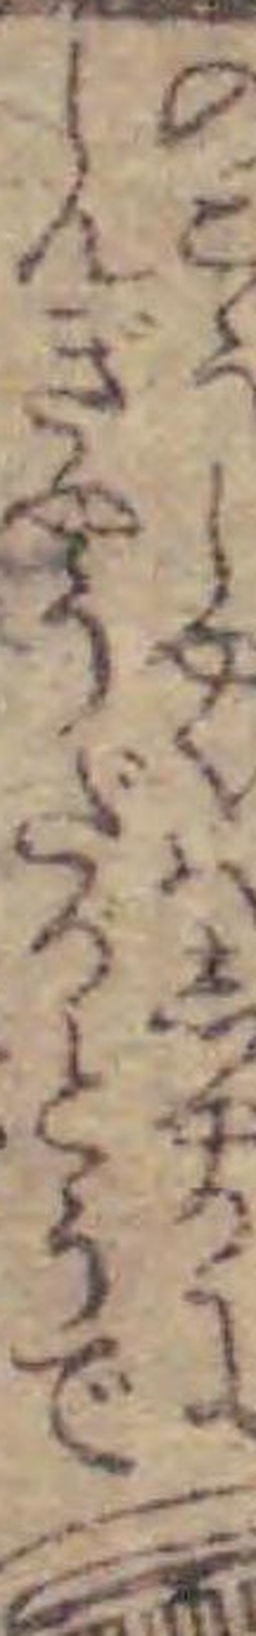しんぎやうだかとうで
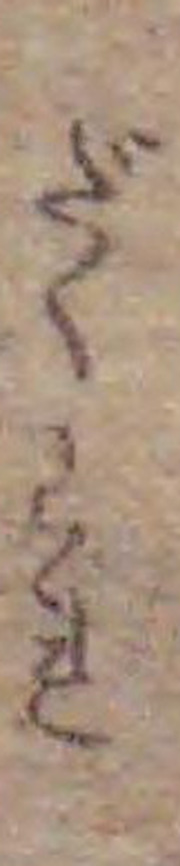だゝわれ
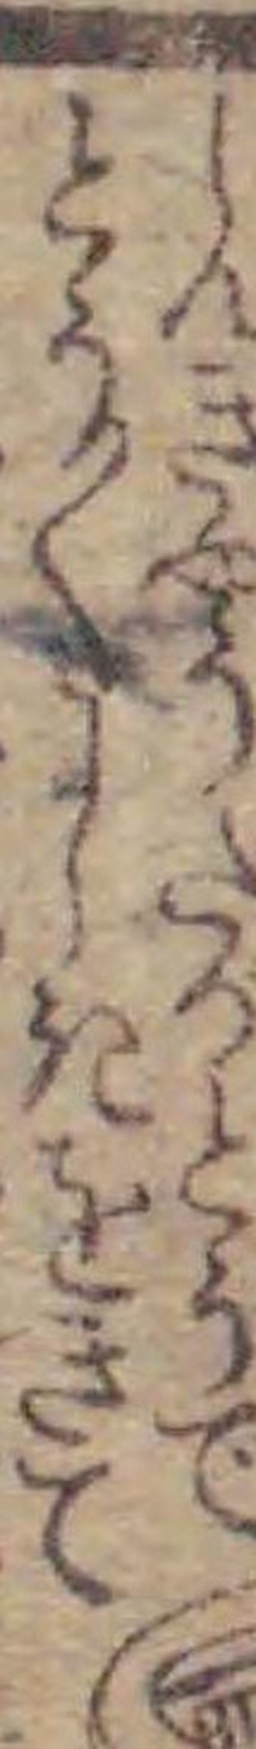とう〳〵にしきをきて
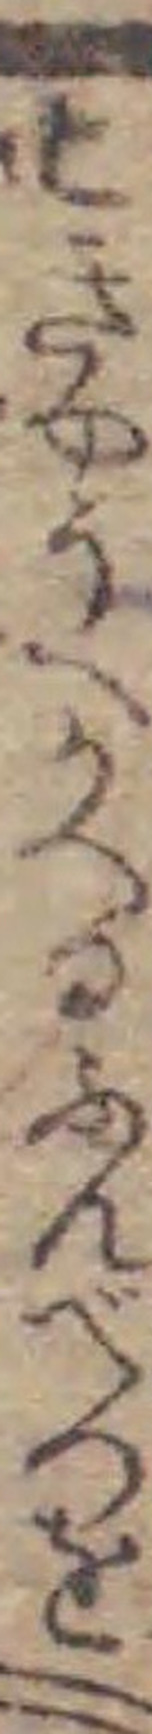こきやうへかへるふんべつを
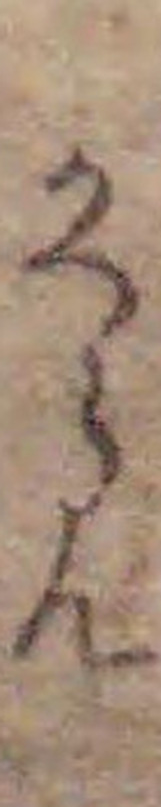かへらん
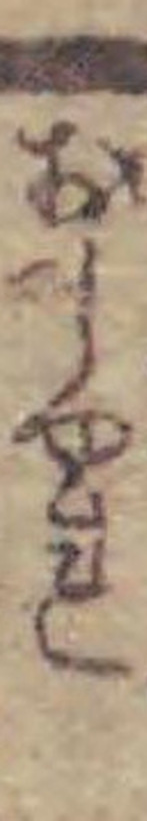おしやれ
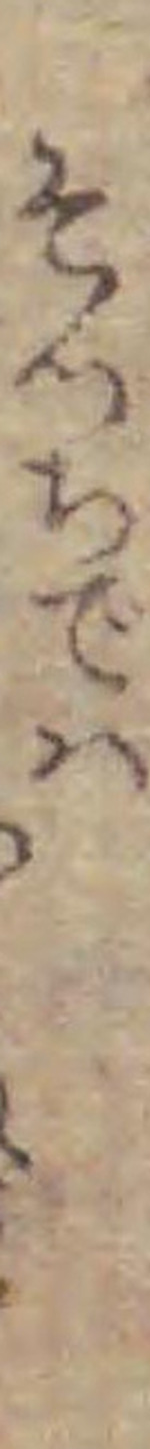そつちでは
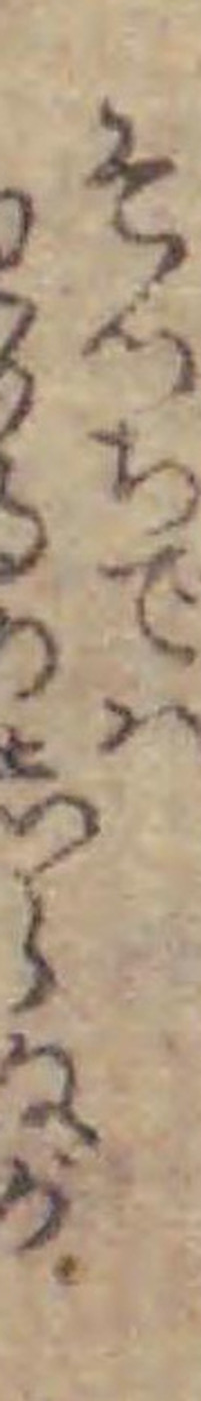わかるかしらぬが
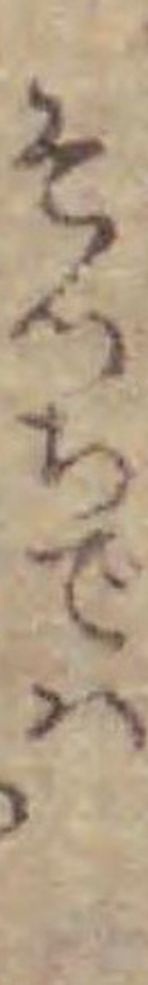そつちでは
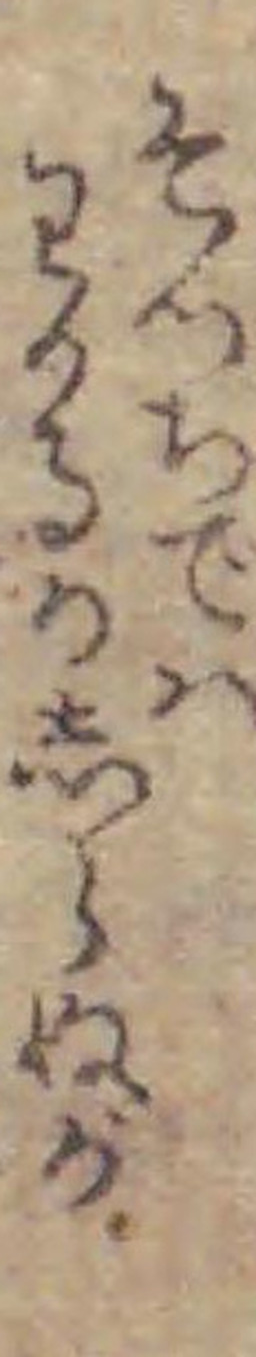わかるかしらぬが
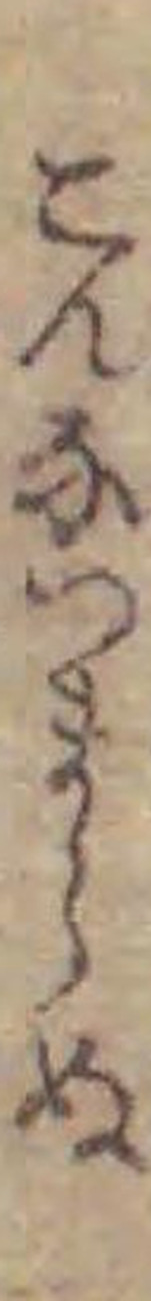こんなつまらぬ
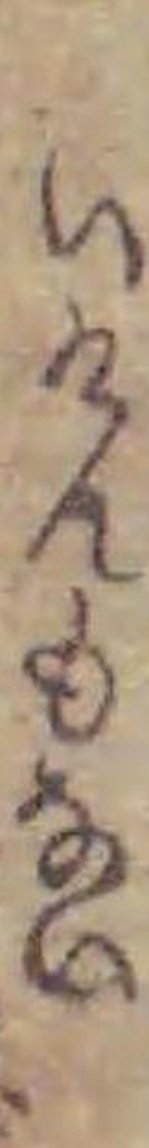いけんもない

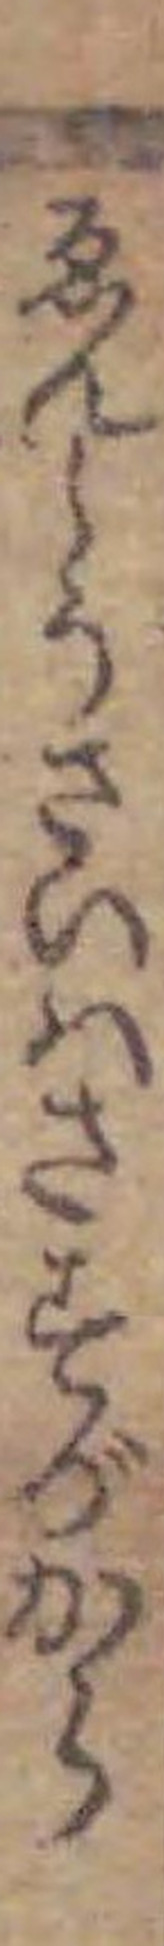ゑんしうさいはさすがから
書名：此奴和日本 : 2巻
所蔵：国立国会図書館 National Diet Library, JAPAN
